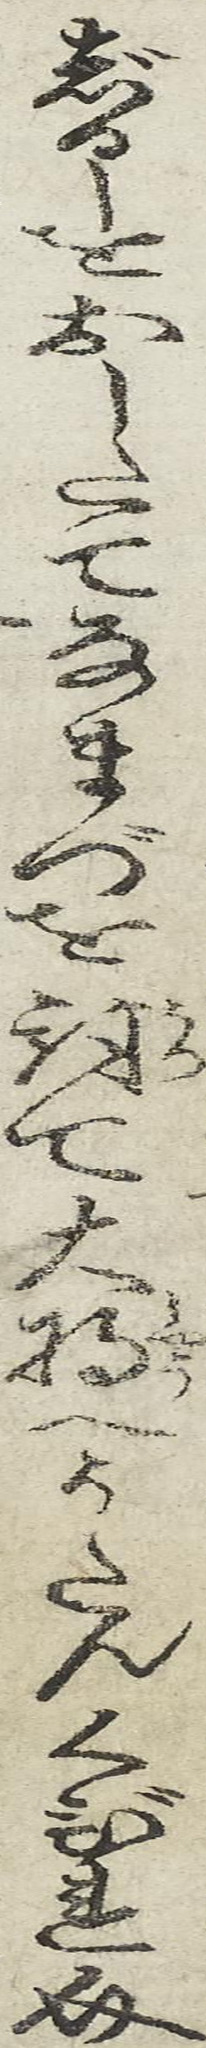じるしをおしたてなまづを討て大将へうたんくびれ成
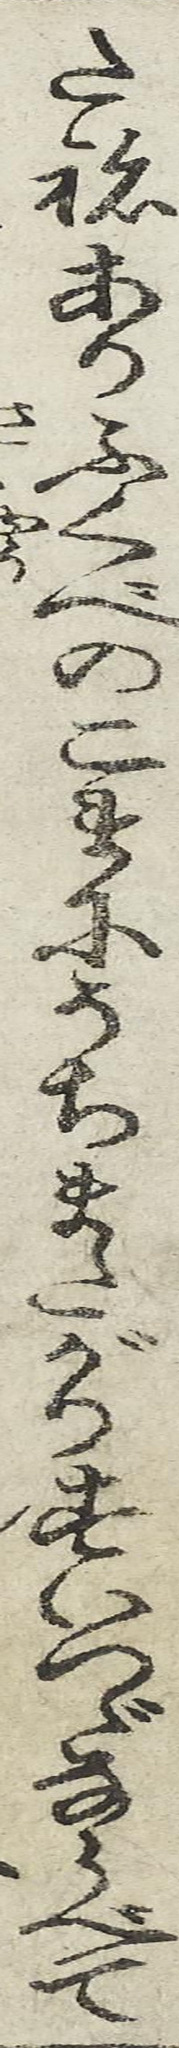たねありふくべのこまにうちまたがりすいつゞならべて
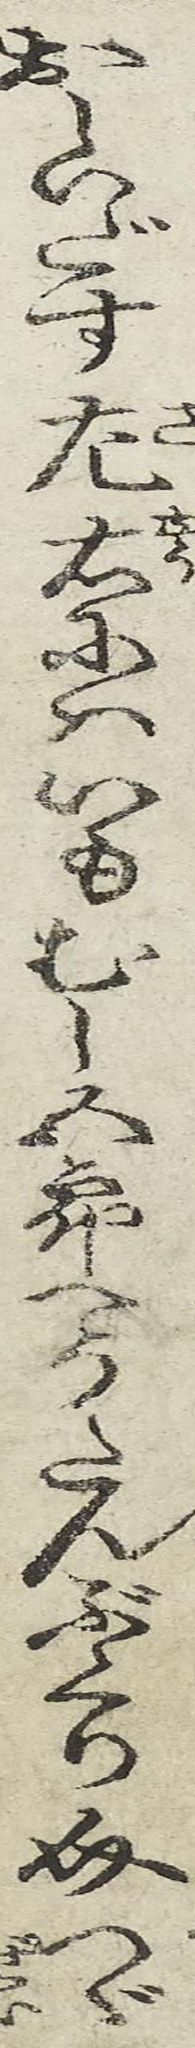おしいだす左右にはいもむし五郎へうたんぶくり成つゞ
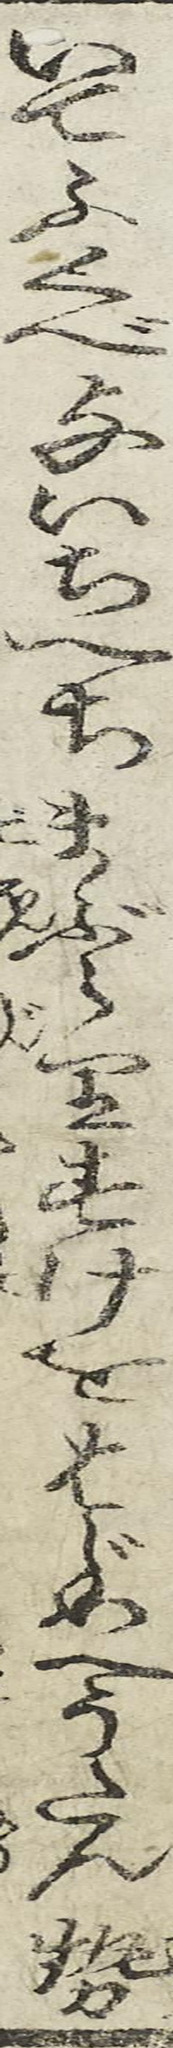いてふくべ与いちへちまぶらりすけをはじめへうたん勢
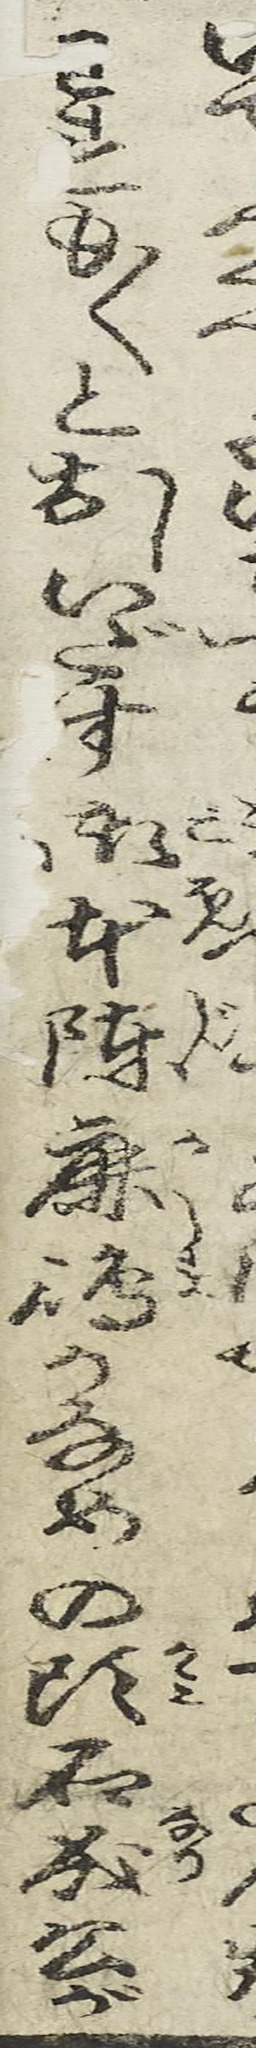われも〳〵とおしいだす御本陣鹿嶋かなめの頭石成公が
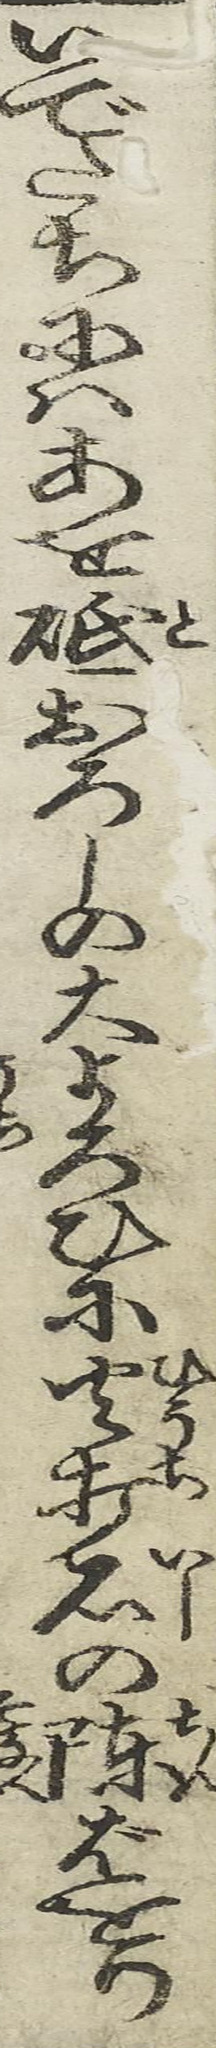いでたちにはあを砥おろしの大よろひに火打石の陣ばをり
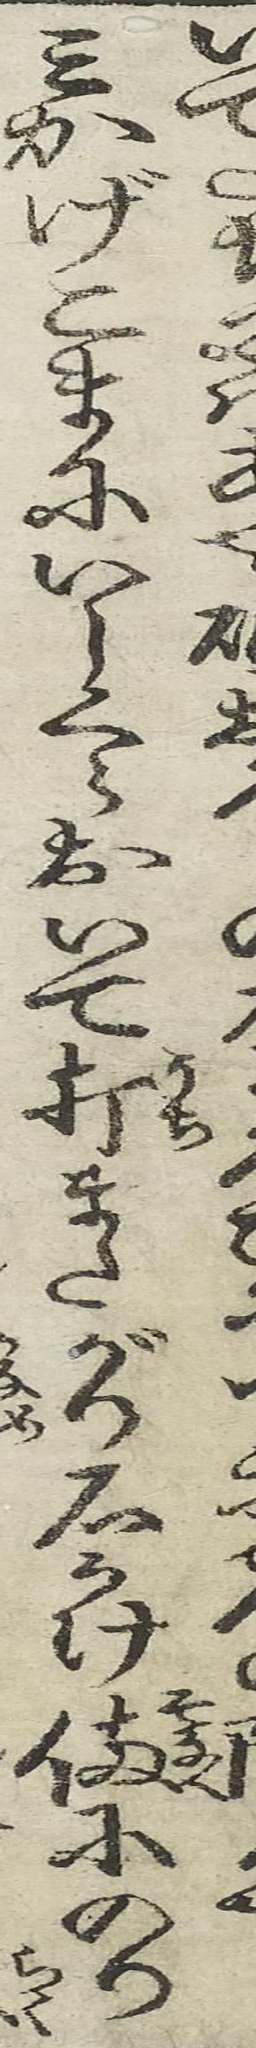みかげこまにいしくらおいて打またがり石かけ備にのり
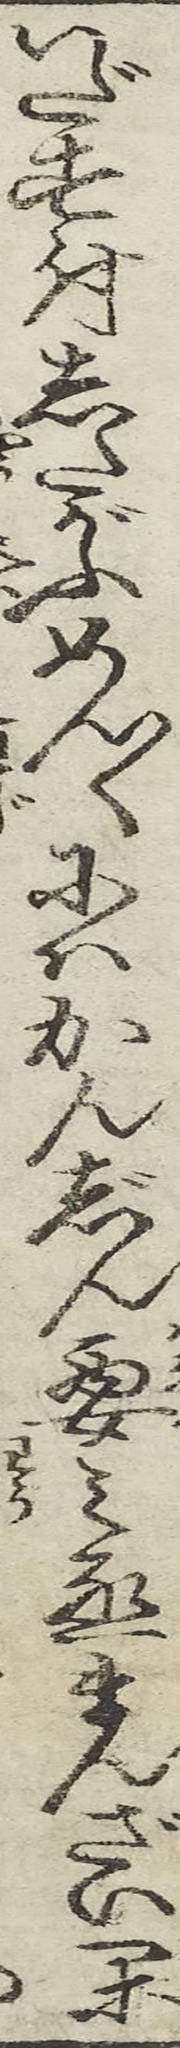いだす付したかふめん〳〵にはかんじん要之丞まんざい楽
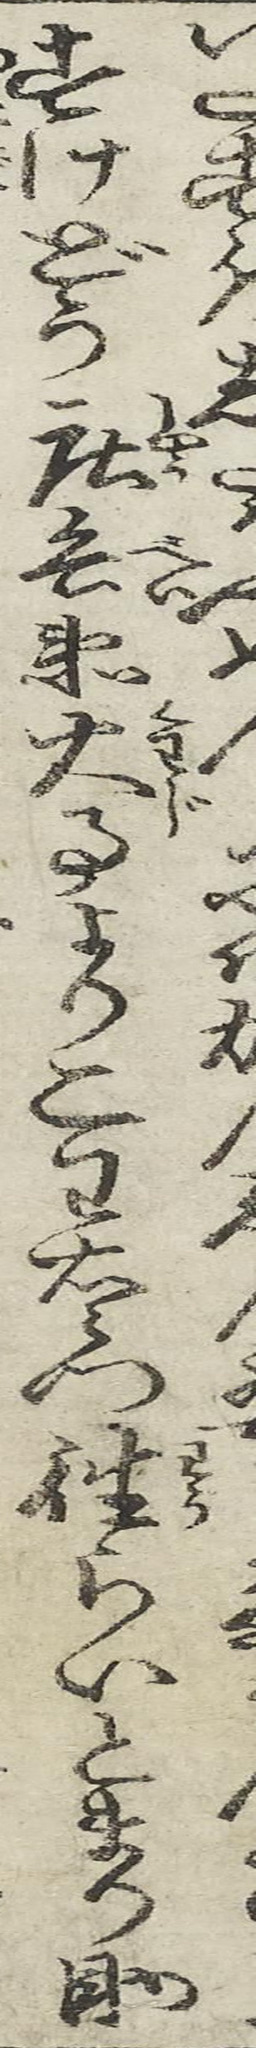すけどう庄兵衛火事よりこわ右衛門往らいとまり助
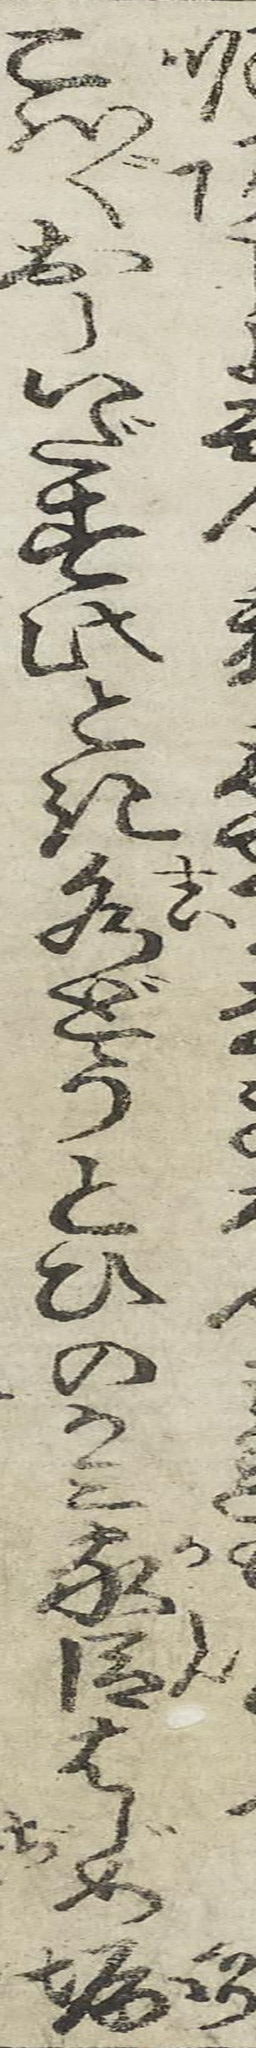こは〴〵おしいだす此とき水どうとひのかみ家臣はじめ堀
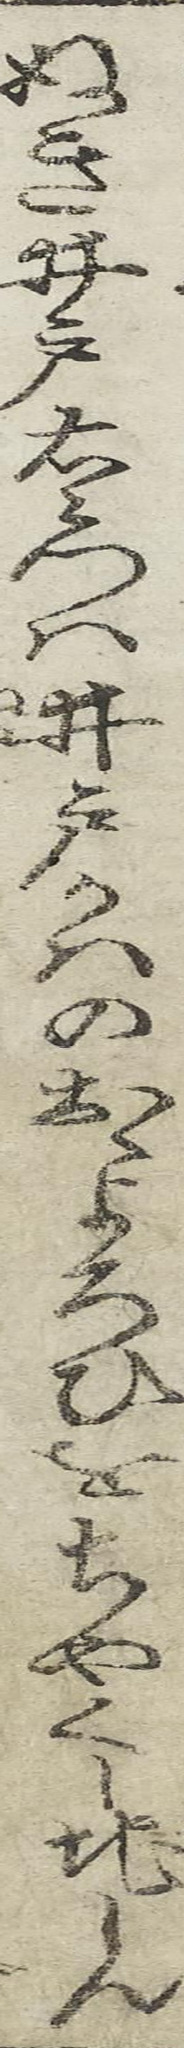ぬき井戸右衛門は井戸かはのおゝよろひをちやくし地しん
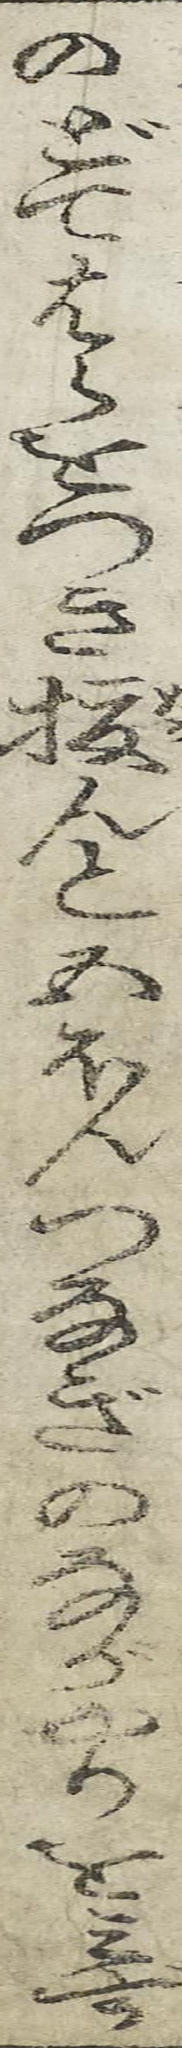のどてはらをつき抜んと五ほんつなぎのながやりをみず
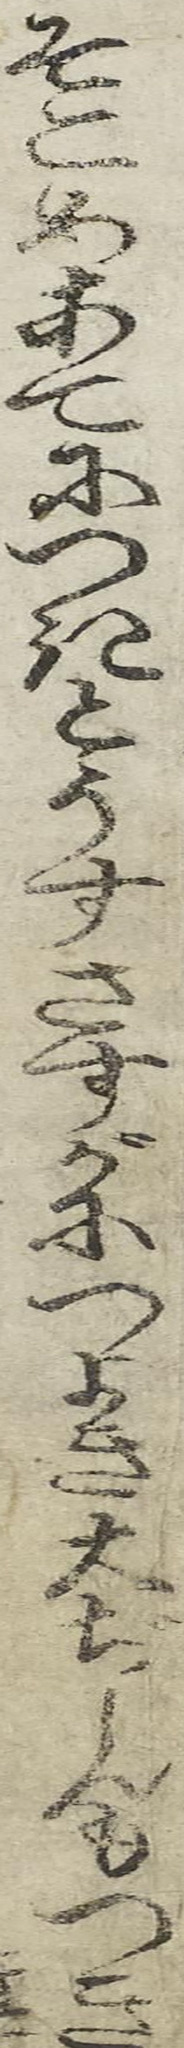そこめあてにつきとうすさすがにつよき大ぢしんもつき
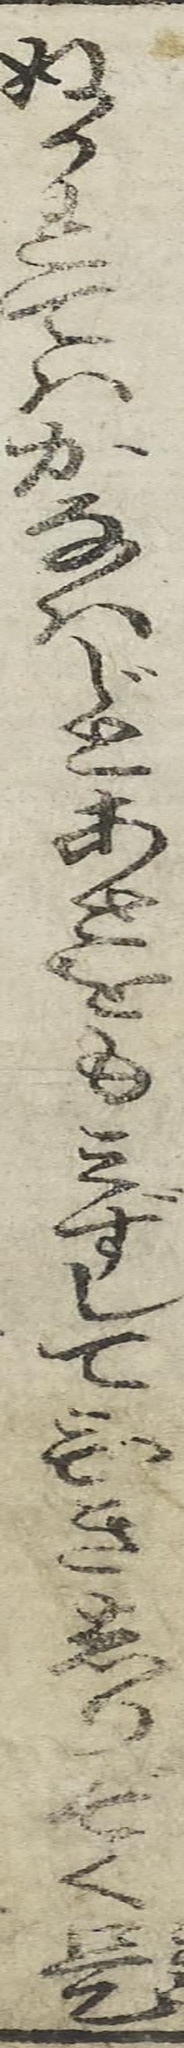ぬかれてはかなはじとあとをもみずしてひきしりぞく是
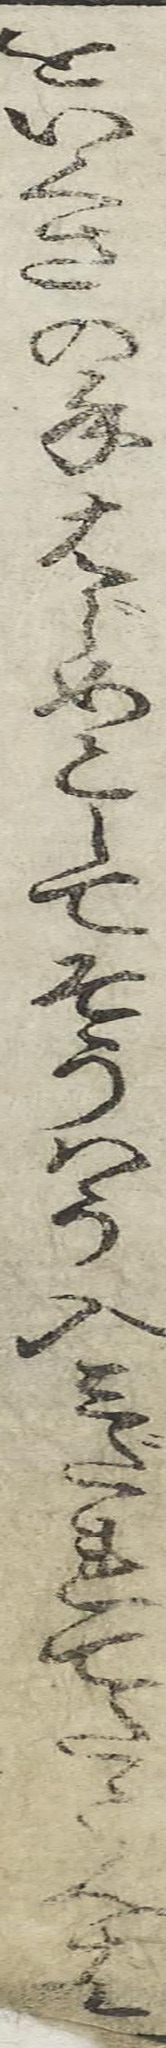をいくさの手はじめとしてそうはう入みだれてたゝかへは
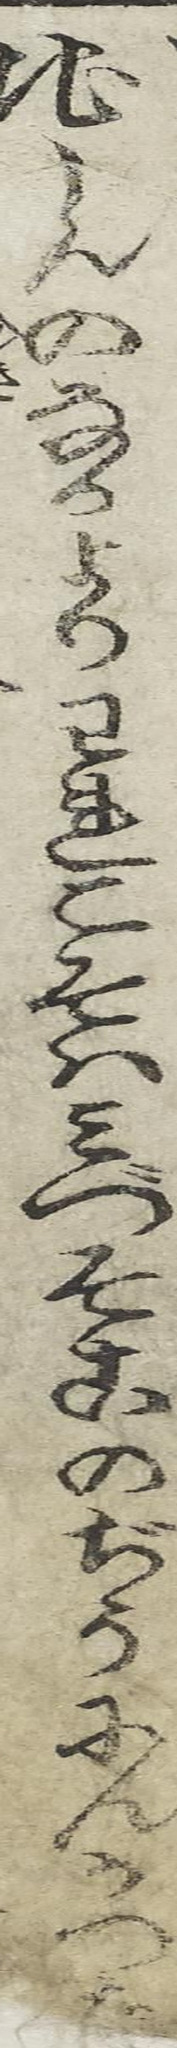地しんのなかよりわれこそはみづそこのぢうにんかつ
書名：新板ぢしん太平記
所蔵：東京大学地震研究所図書室 Earthquake Research Institute Library, The University of Tokyo, JAPAN
